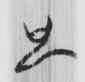也
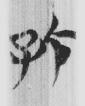孤
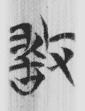敢
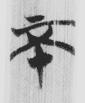不
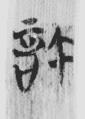許
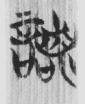諾
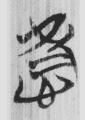恣
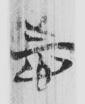志
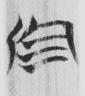於
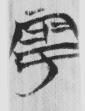𩁹
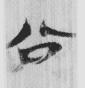公
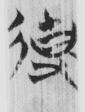𫹒
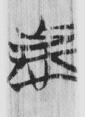者
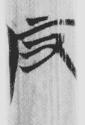反
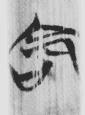命
